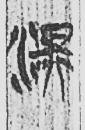淏
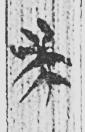求
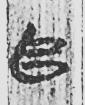𠂤
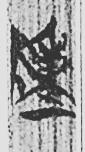陳
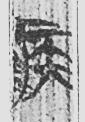疾
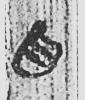目
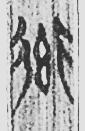率
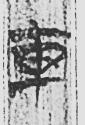車
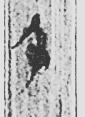千
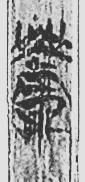{亠舛車}
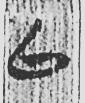㠯（以）
